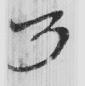乃
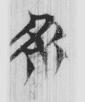豕
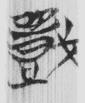{吅豆戈}
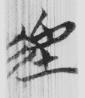𫊟
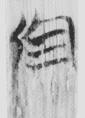於
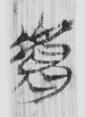膚
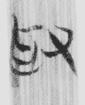取
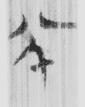{八千}
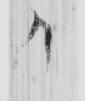人
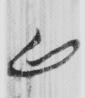㠯（以）
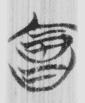會
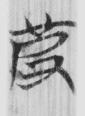皮
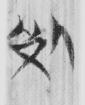死
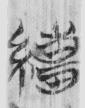{糸山畕}
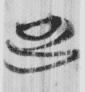疋
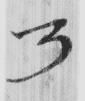乃
